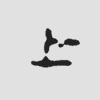上
